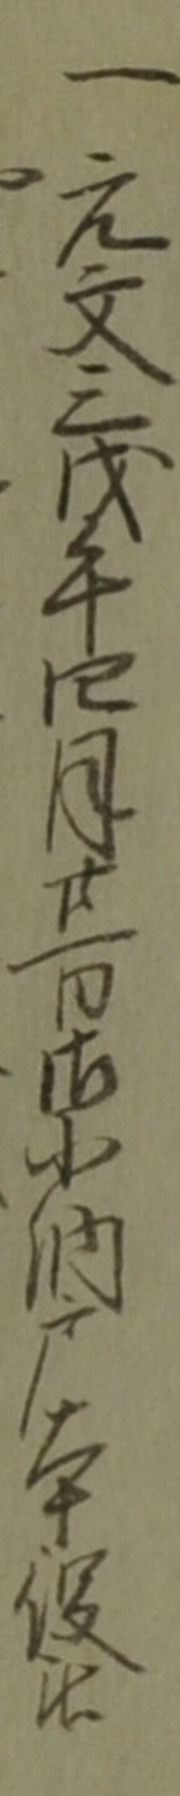一元文三戊午四月廿一日御小納戸本役被
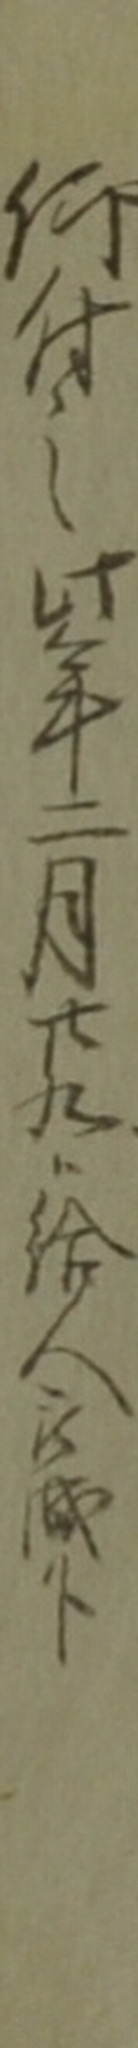仰付之此年二月廿九日給人被成下
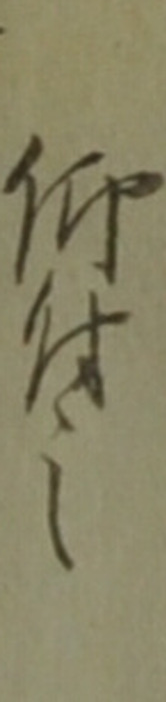仰付之
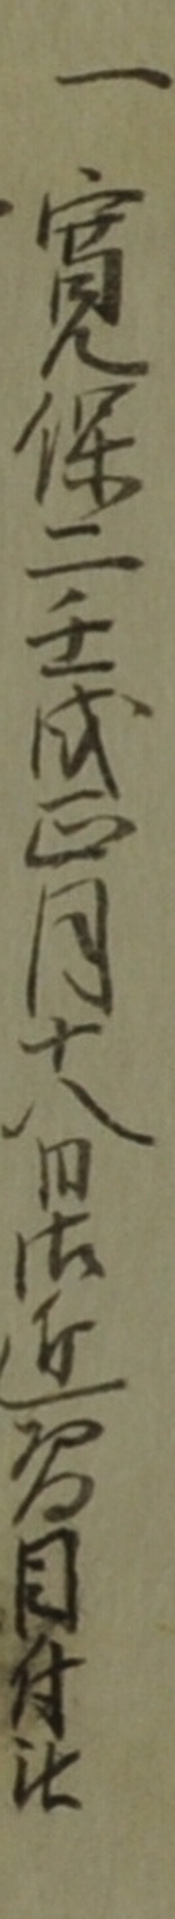一寛保二壬戌正月十八日御近習目付被
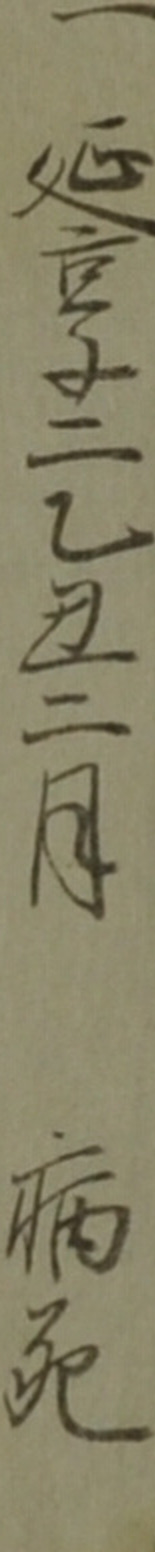一延享二乙丑二月病死
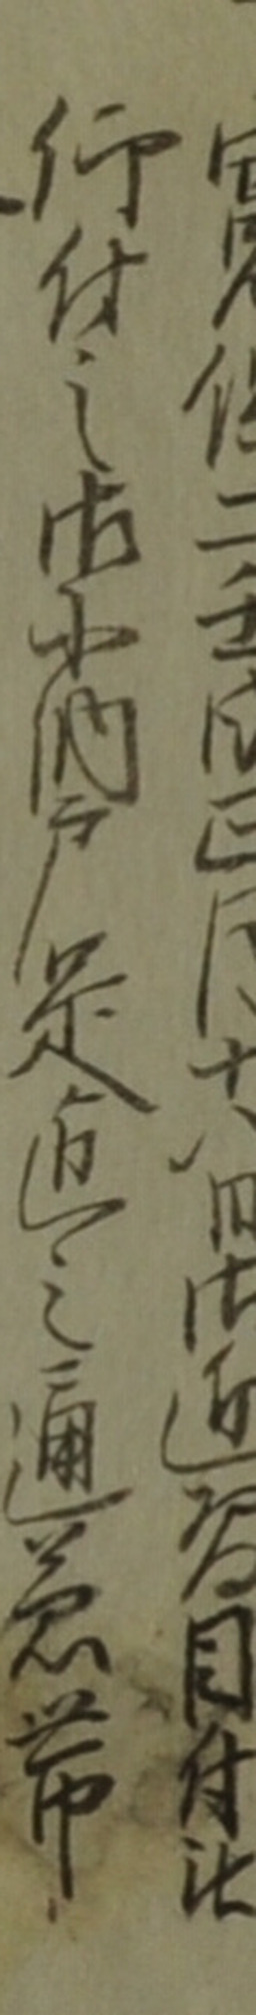仰付之御小納戸是迄之通兼帯
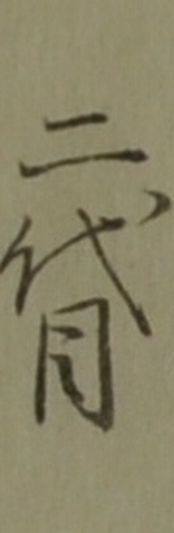二代目
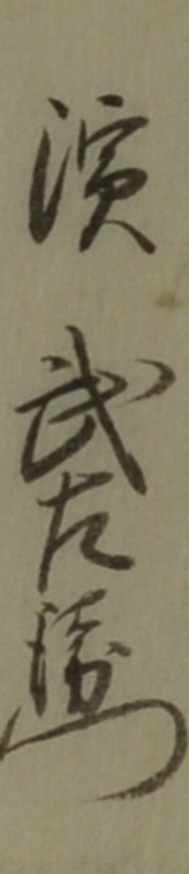濵武左衛門
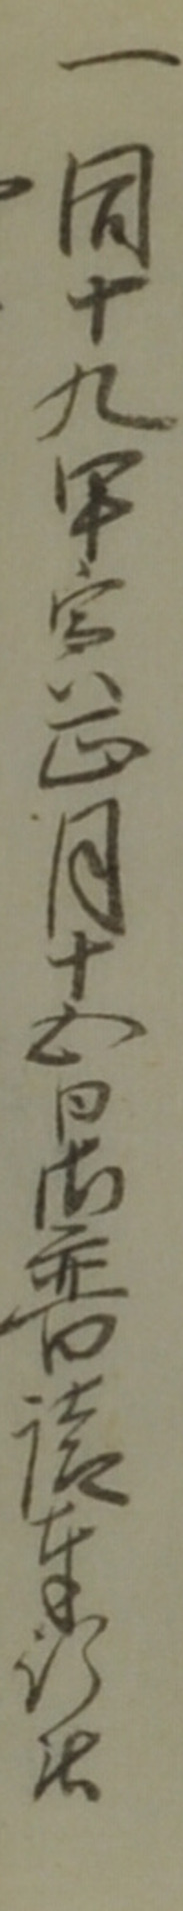一同十九甲寅正月十五日御普請奉行被
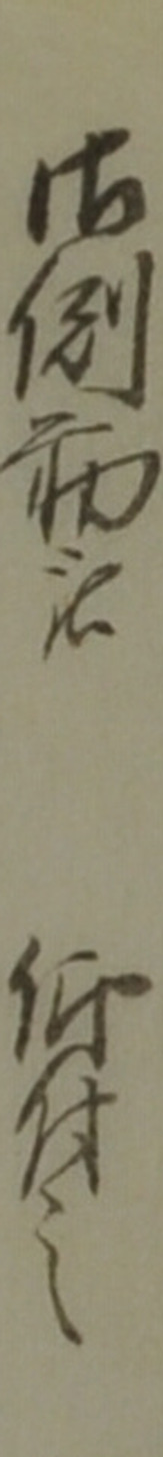御側勤被仰付之
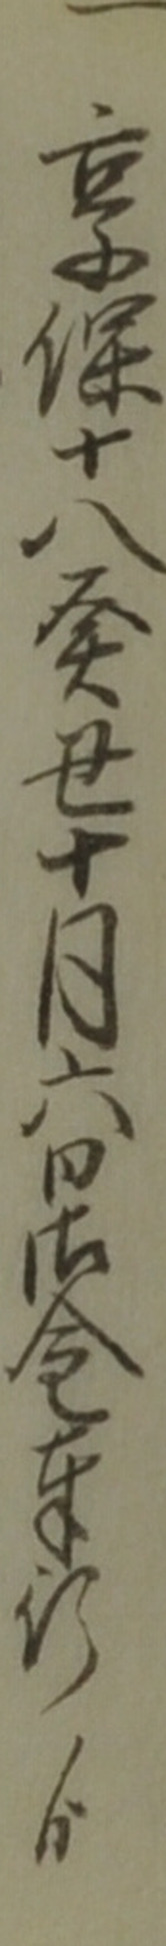一享保十八癸丑十月六日御金奉行ゟ
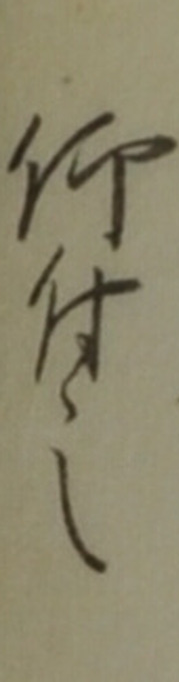仰付之
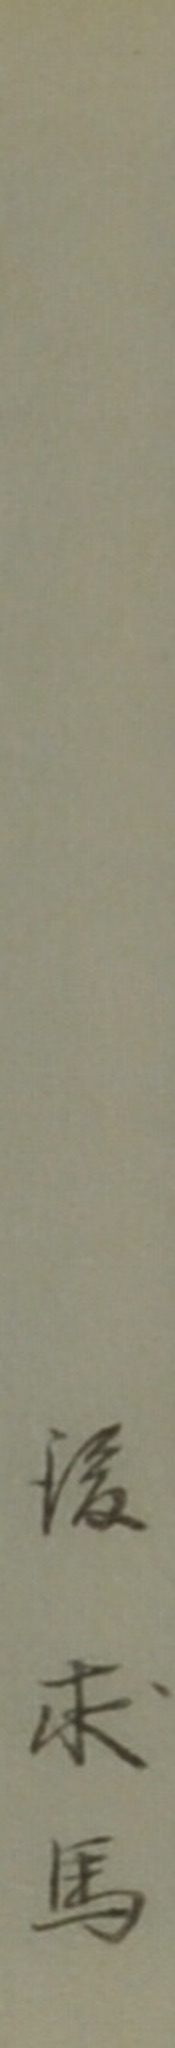後求馬
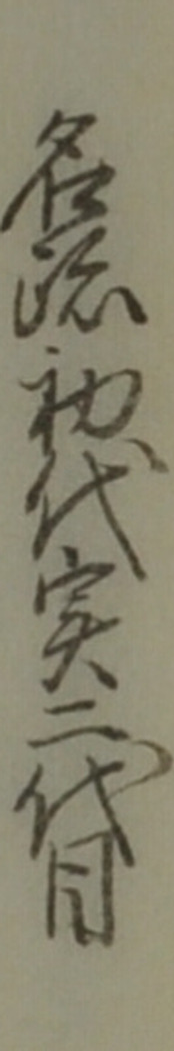名跡初代実二代目
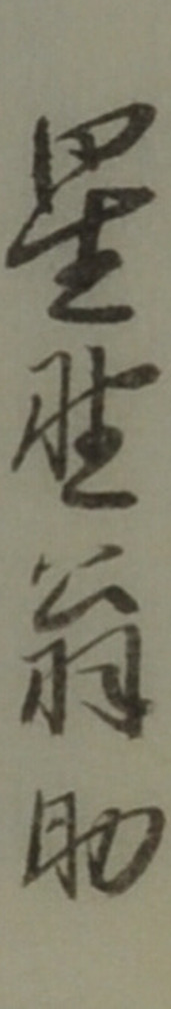星野翁助
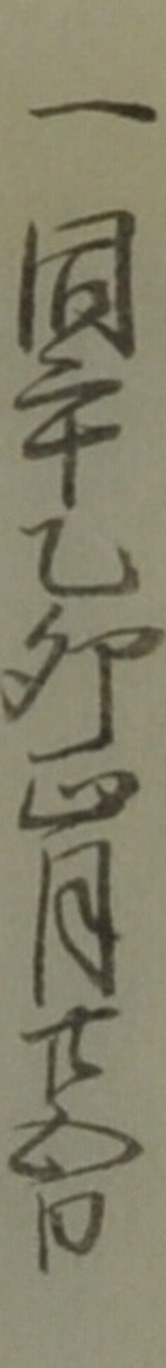一同年乙卯正月廿五日
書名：諸御役代々録（五）
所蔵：伊那市立高遠町図書館・合同会社AMANE
